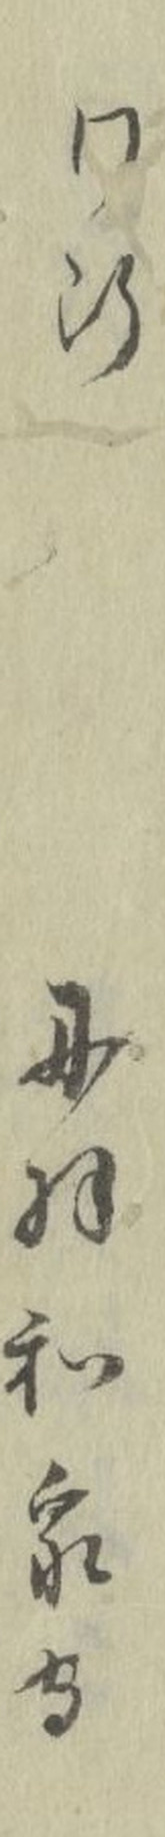同断丹羽和泉守
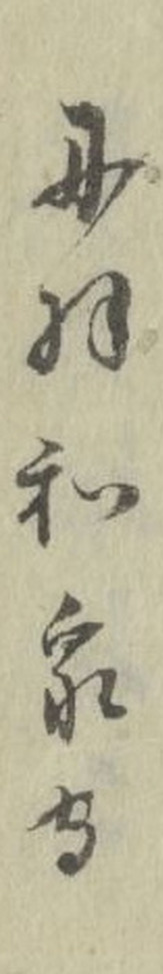同断丹羽和泉守
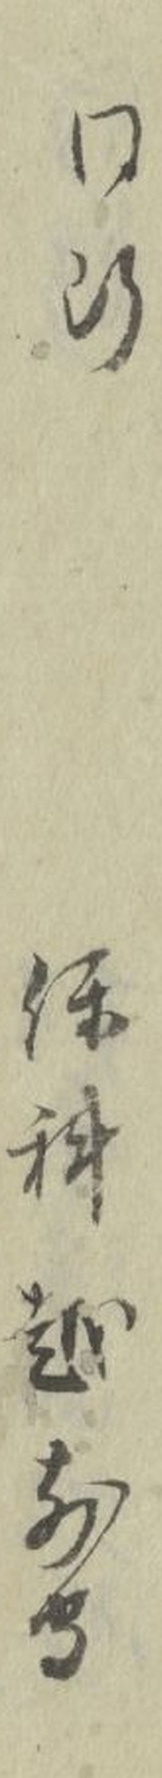同断保科越前守
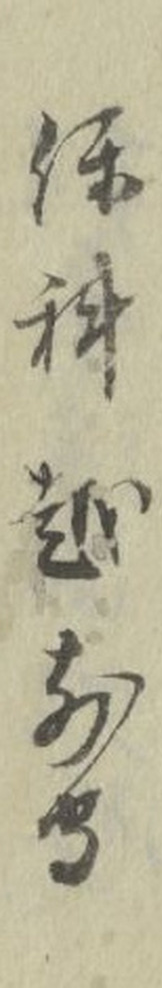同断保科越前守
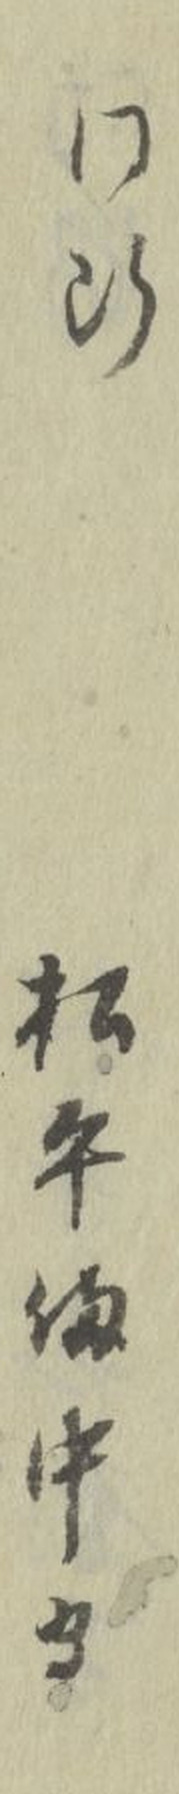同断松平備中守
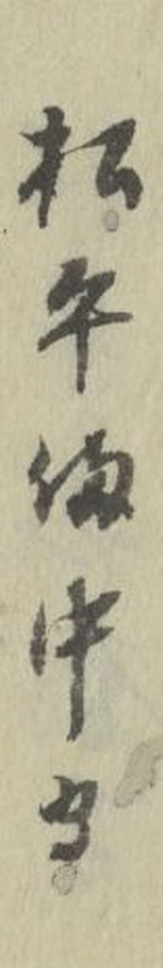同断松平備中守
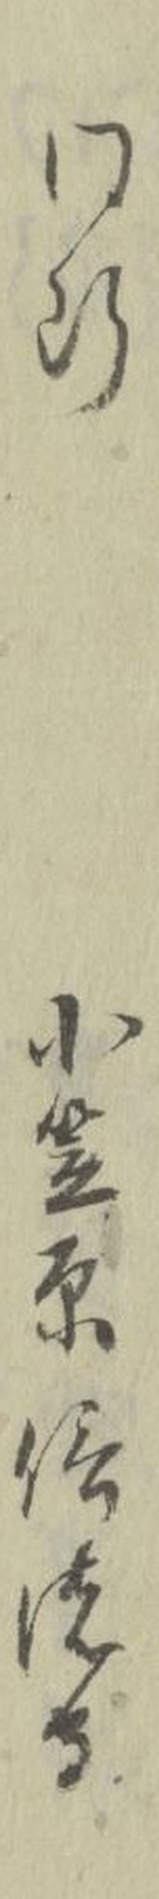同断小笠原信濃守
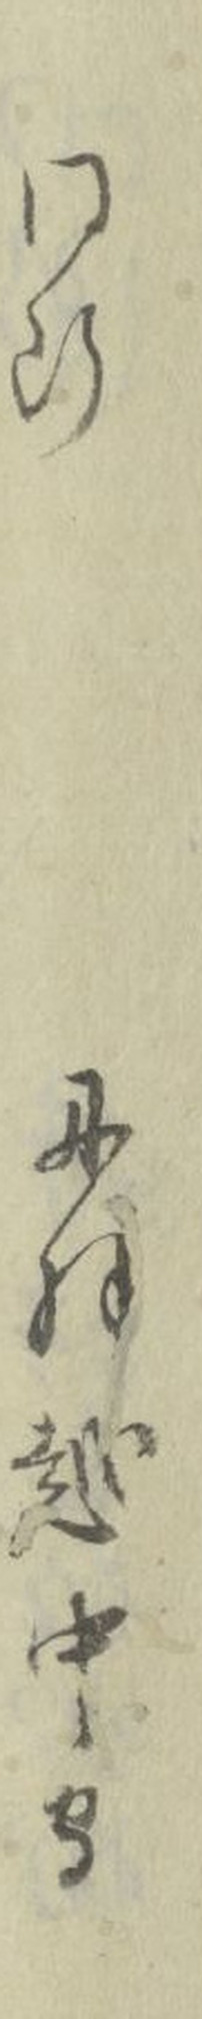同断丹羽越中守
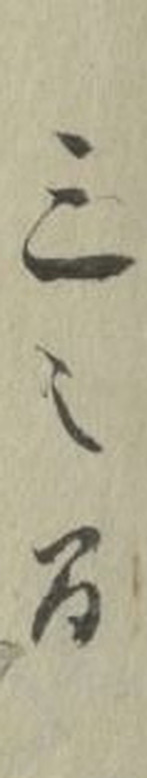三之間
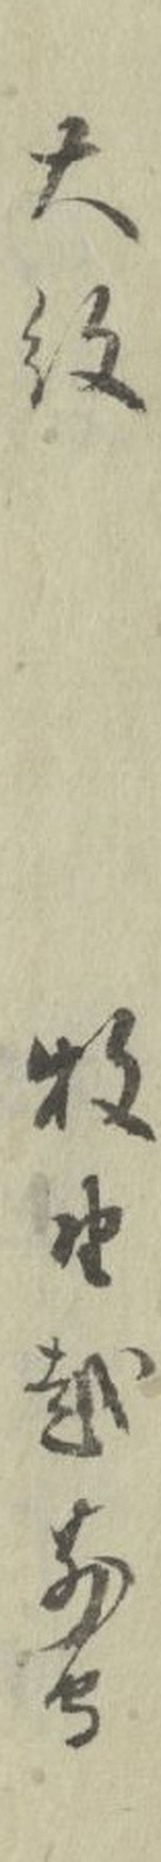大紋牧野越前守
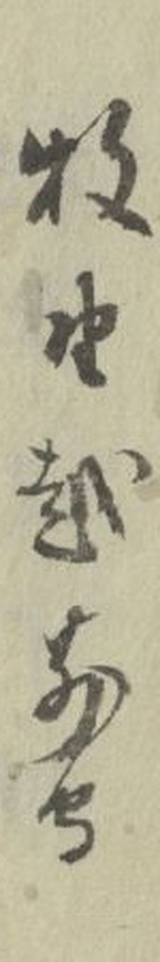同断保科越前守
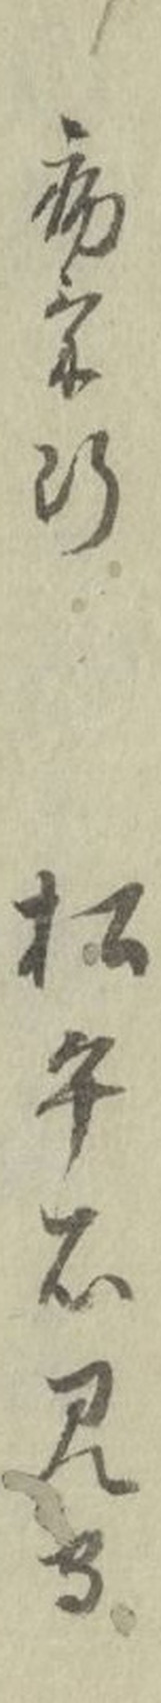病気断松平石見守
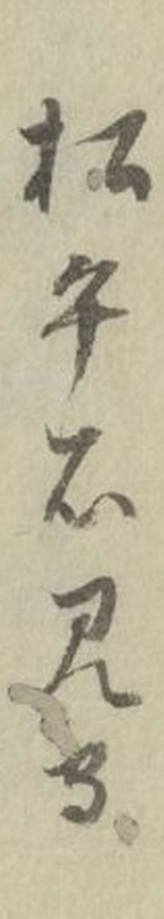病気断松平石見守

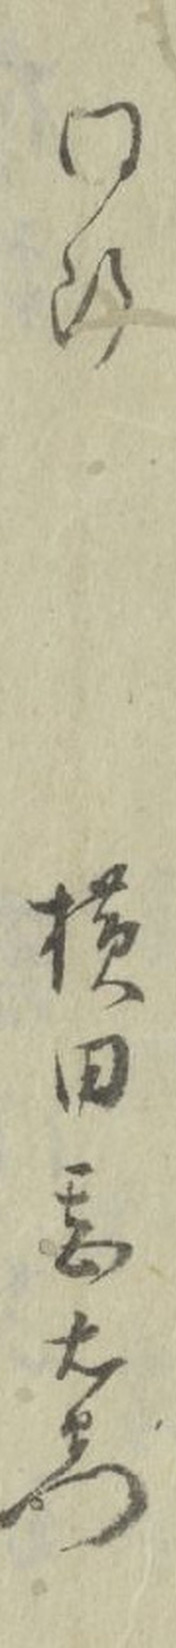同断横田甚右衛門
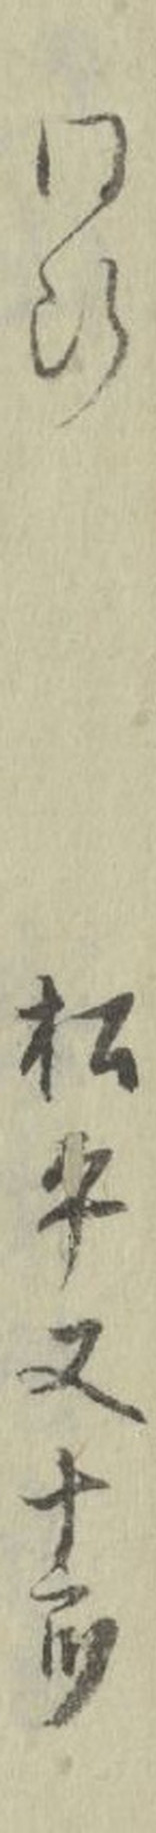同断松平又十郎
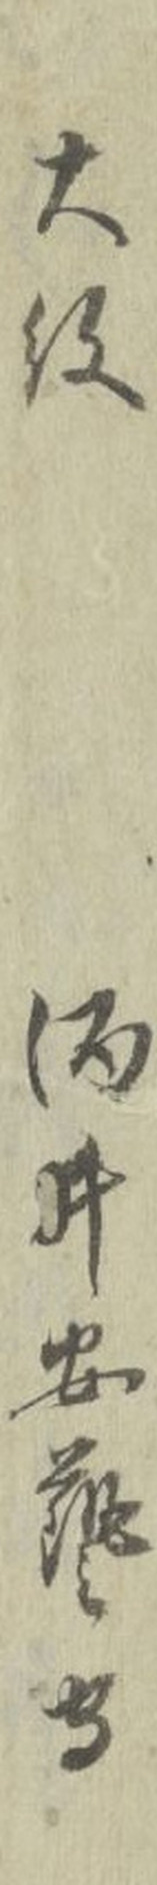大紋酒井安芸守
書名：琉球来朝記 自一至七
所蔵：University of the Ryukyus Library
